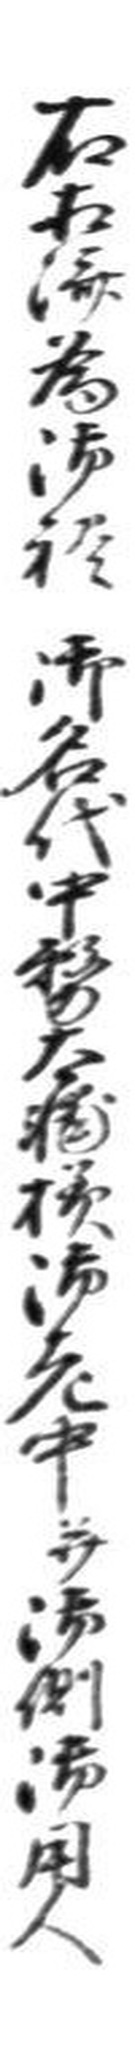右相済為御礼御名代中務大輔様御老中并御側御用人
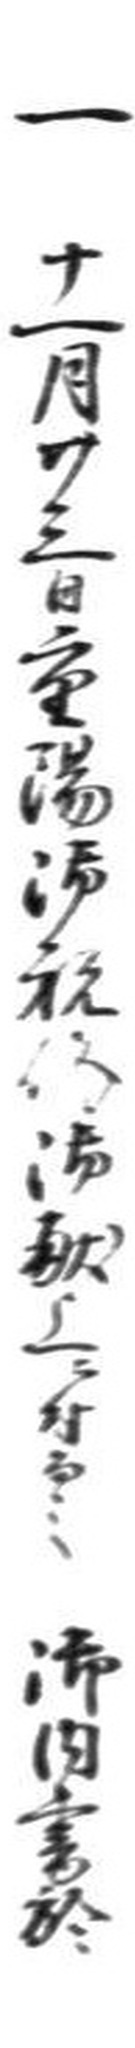一十一月廿三日重陽御祝儀御献上ニ付而之御内書於
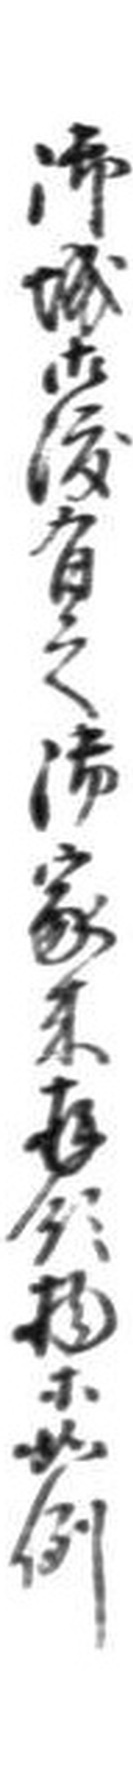御城御渡有之御家来拝領物等如例
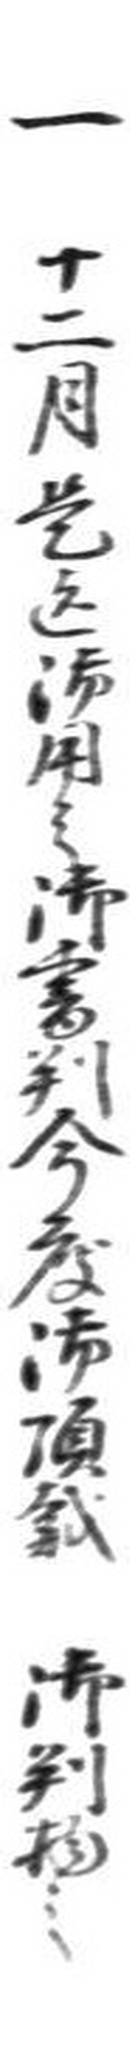一十二月是迄御用之御書判今度御頂戴御判物之
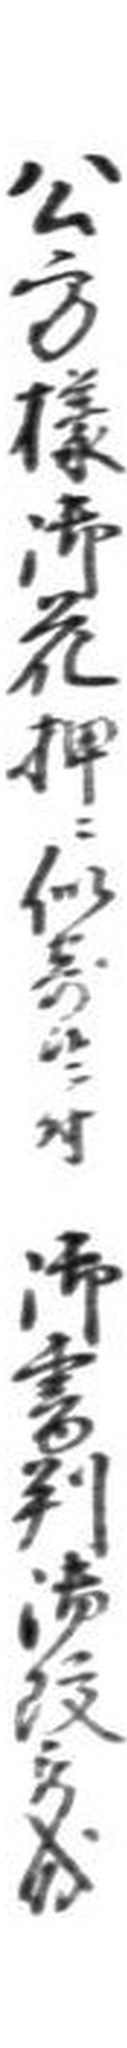公方様御花押ニ似寄候ニ付御書判御改被成
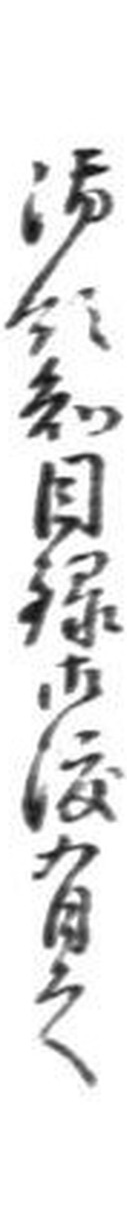御領知目録御渡有之
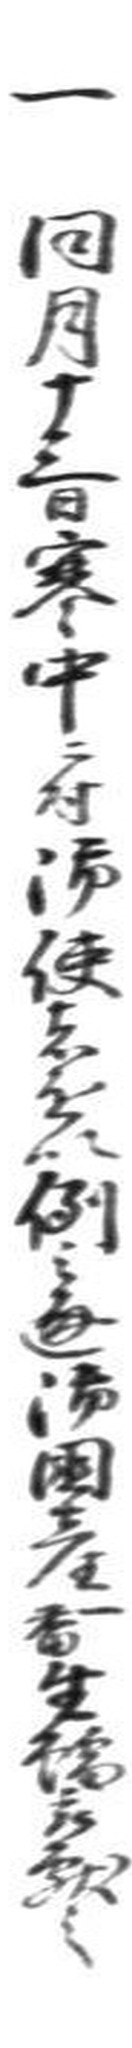一同月十三日寒中ニ付御使者を以例之通御国産一番生鱈被献之

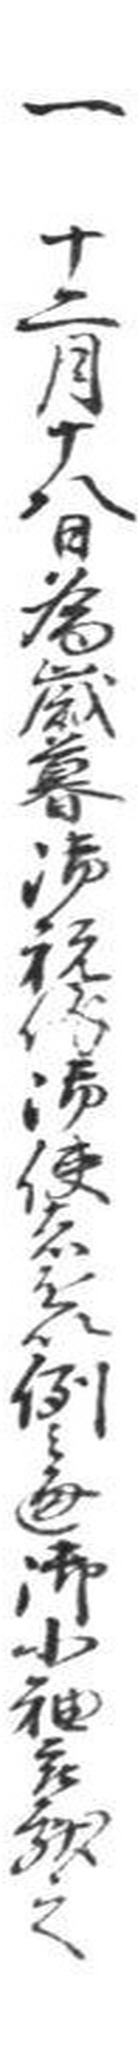一十二月十八日為歳暮御祝儀御使者を以例之通御小袖被献之
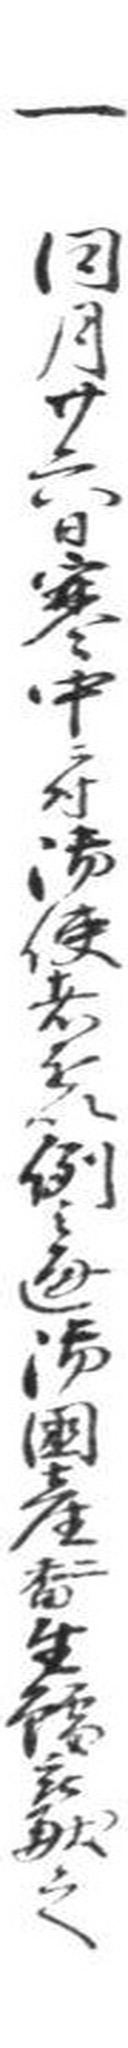一同月廿六日寒中ニ付御使者を以例之通御国産二番生鱈被献之
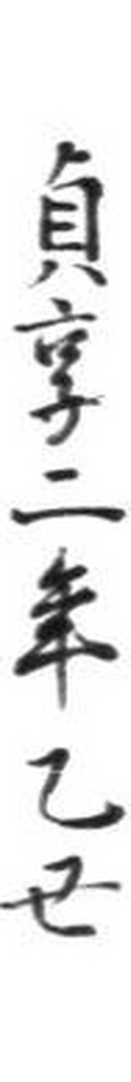貞享二年乙丑
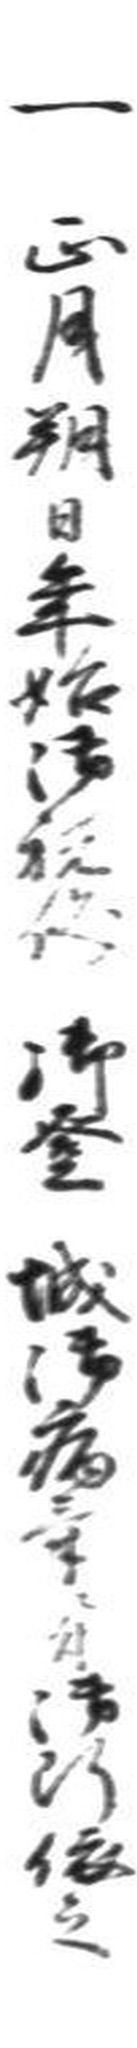一正月朔日年始御祝儀御登城御病気ニ付御断依之
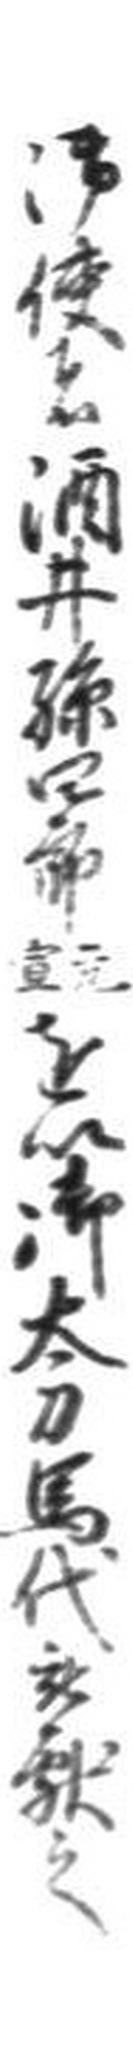御使者酒井孫四郎元宣を以御太刀馬代被献之
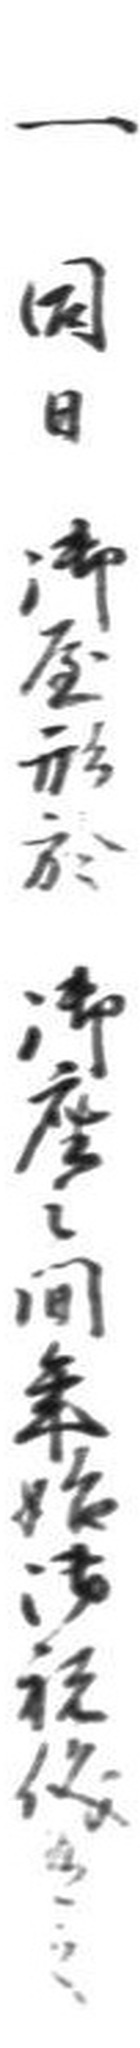一同日御屋形於御座之間年始御祝儀有之
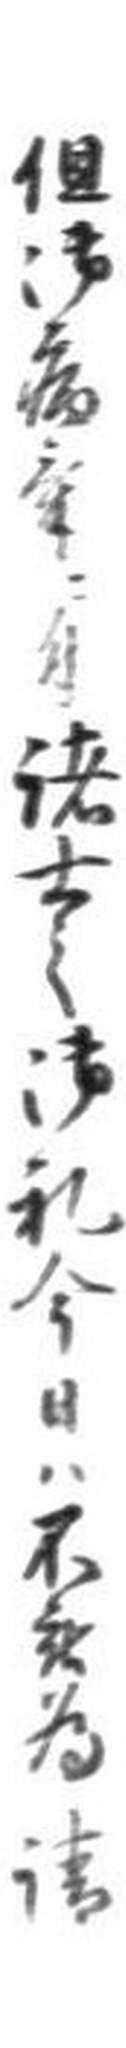但御病気ニ付諸士之御礼今日ハ不被為請
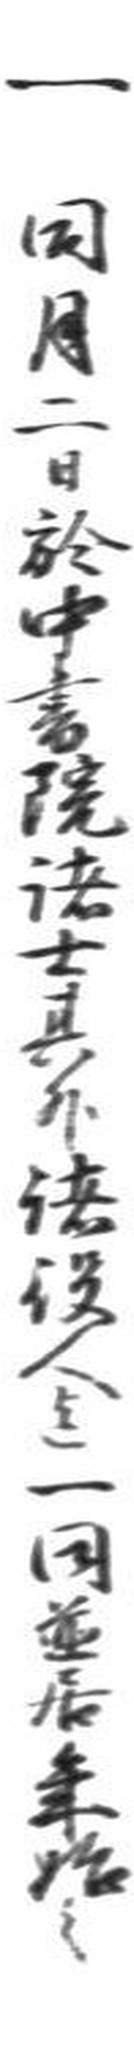一同月二日於中書院諸士其外諸役人迄一同並居年始之
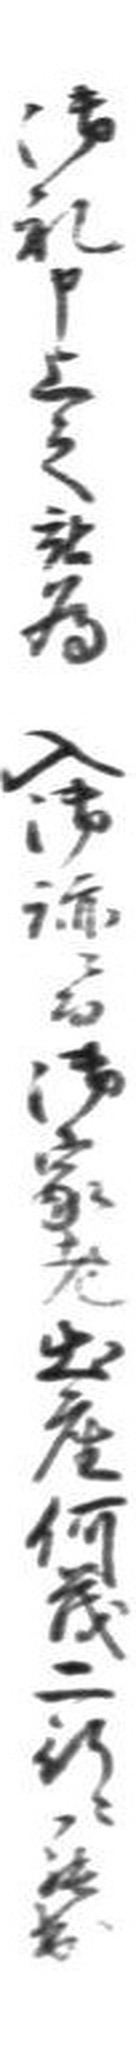御礼申上之被為入御跡ニ而御家老出座何も二行ニ罷出
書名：家譜 十五 綱昌公 従天和元年到元禄十二年
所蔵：福井県文書館 Fukui Prefectural Archives
